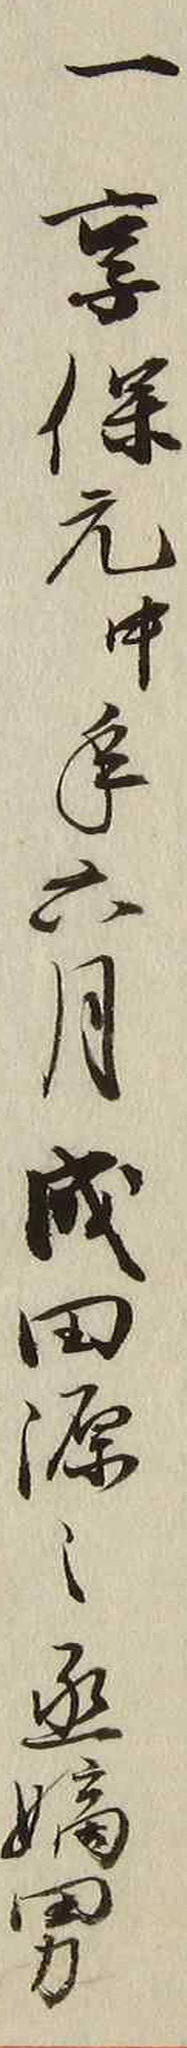一享保元申年六月成田源之丞嫡男
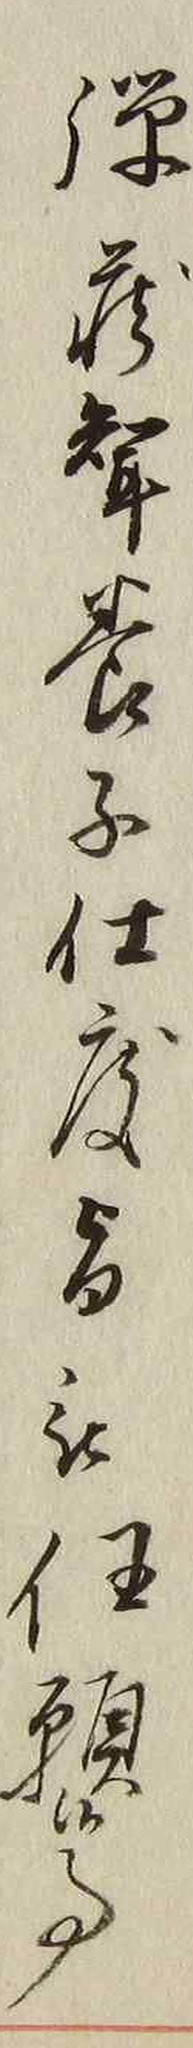弾蔵聟養子仕度旨被任願候事
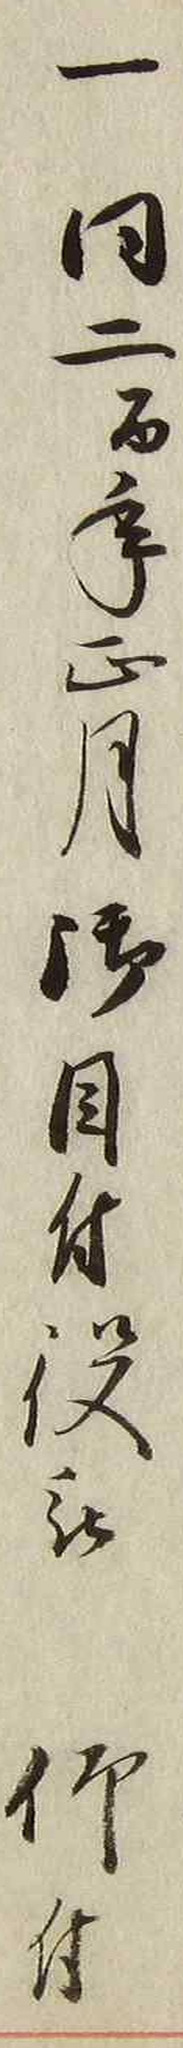一同二酉年正月御目付役被仰付
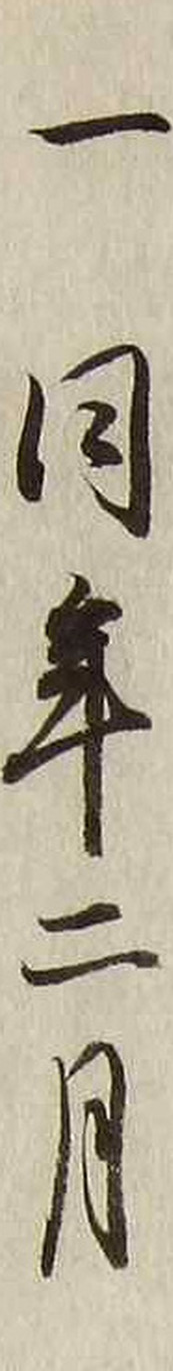一同年二月
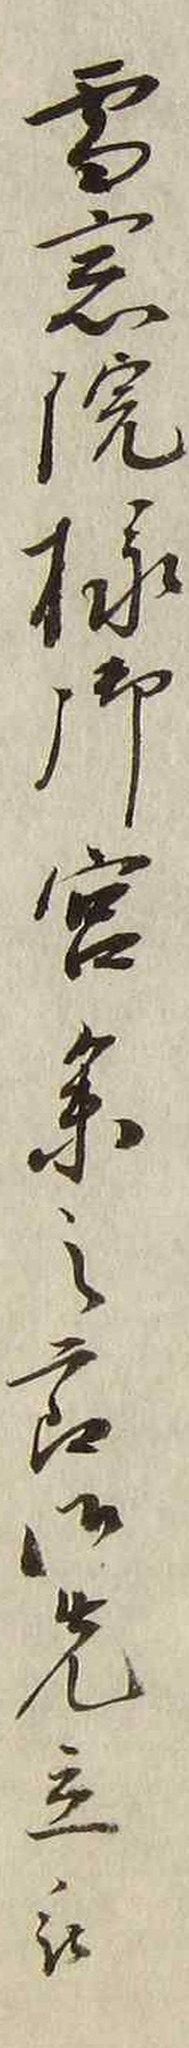雪窓院様御宮参之節御先立被
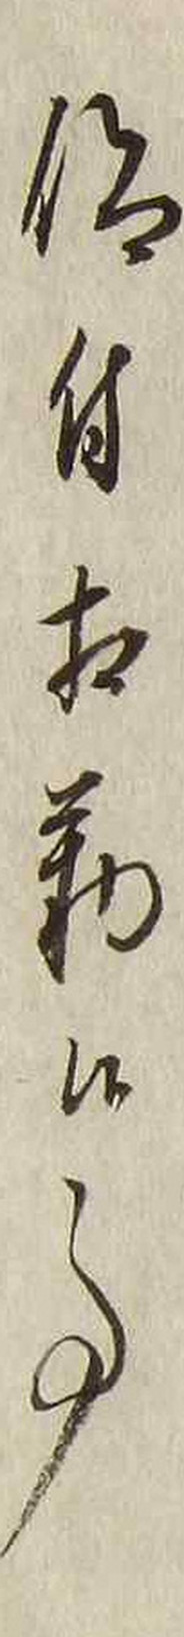仰付相勤候事

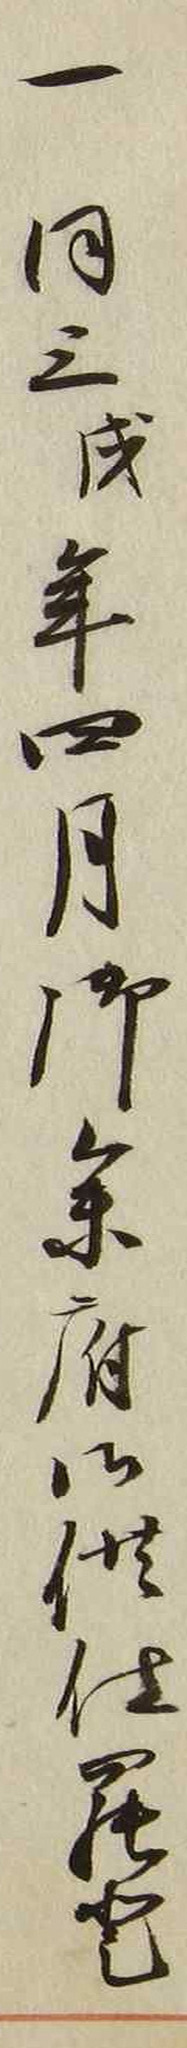一同三戌年四月御参府御供仕罷登
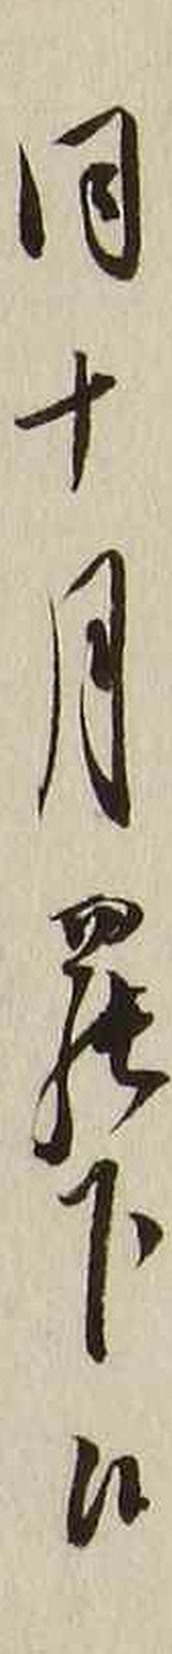同十月罷下候
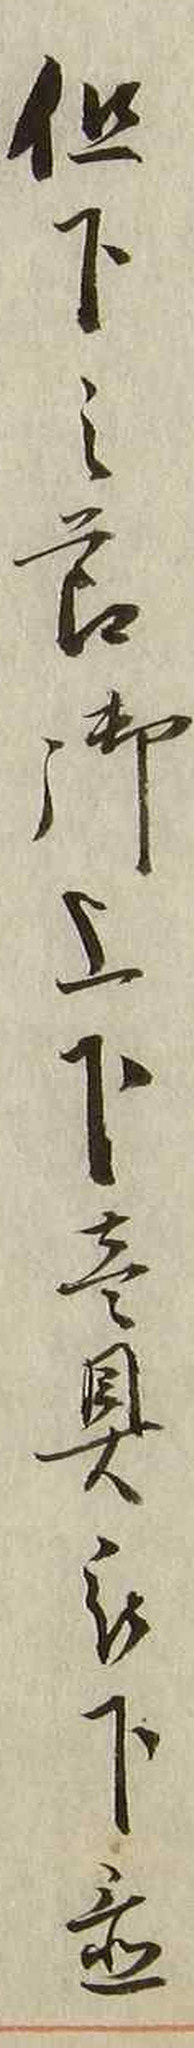但下之節御上下壱具被下置
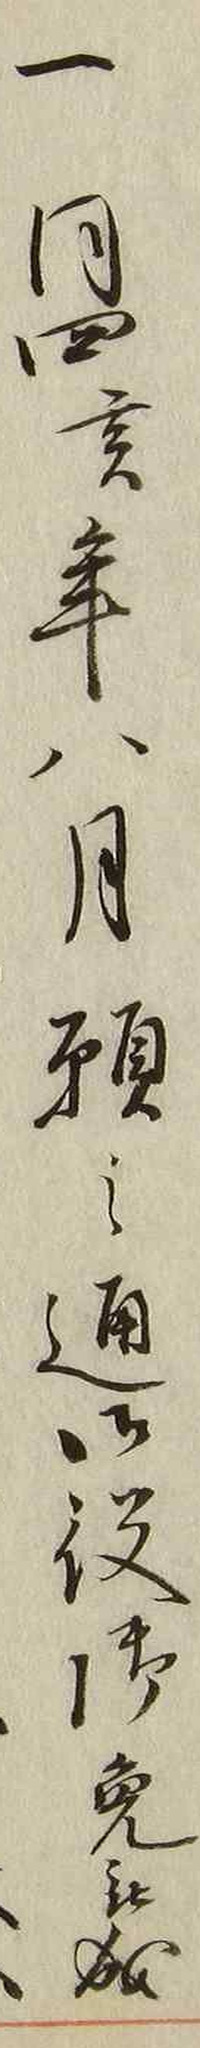一同四亥年八月願之通御役御免被成
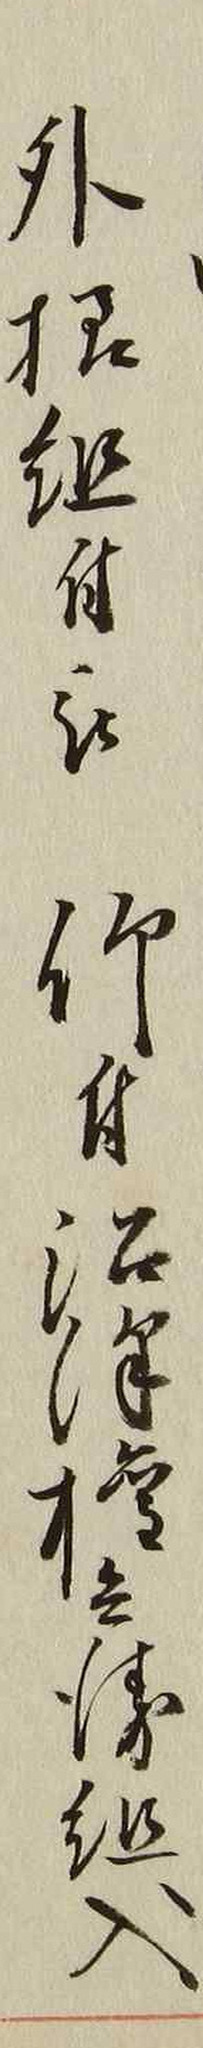外様組付被仰付沼沢権兵衛組へ入
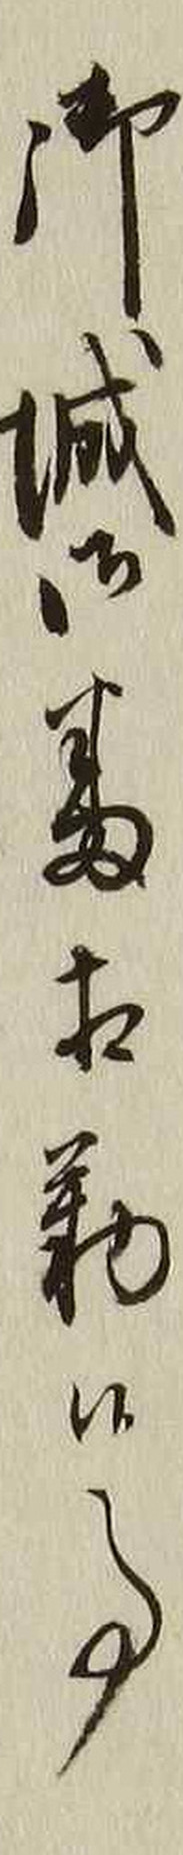御城御番相勤候事
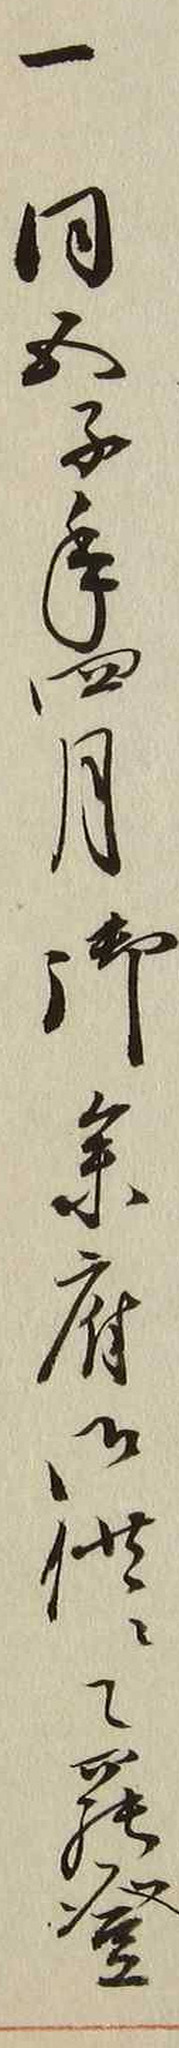一同五子年四月御参府御供ニて罷登
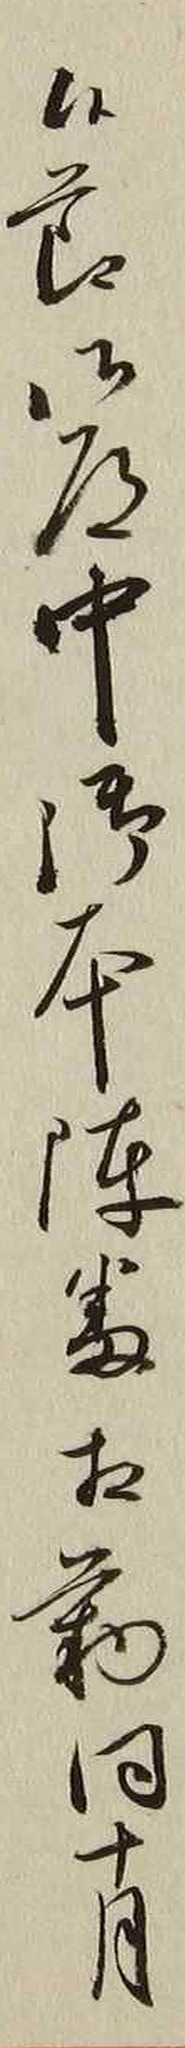候節御道中御本陣番相勤同十月
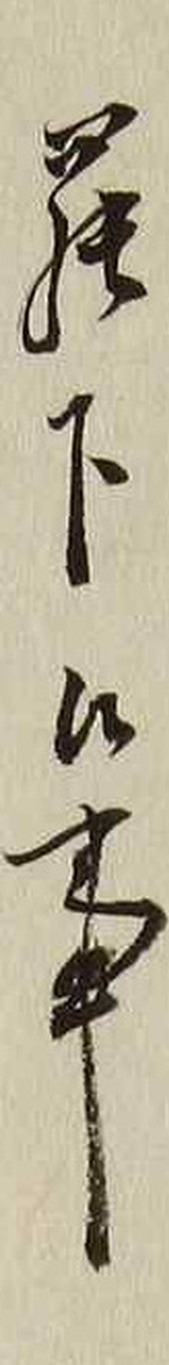罷下候事
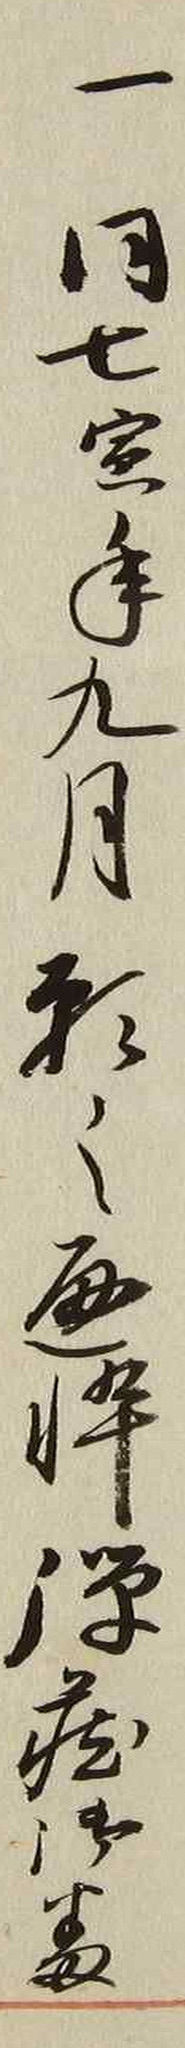一同七寅年九月願之通忰弾蔵御番
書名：諸士系譜　巻之22　い之部22
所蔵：会津若松市立会津図書館
